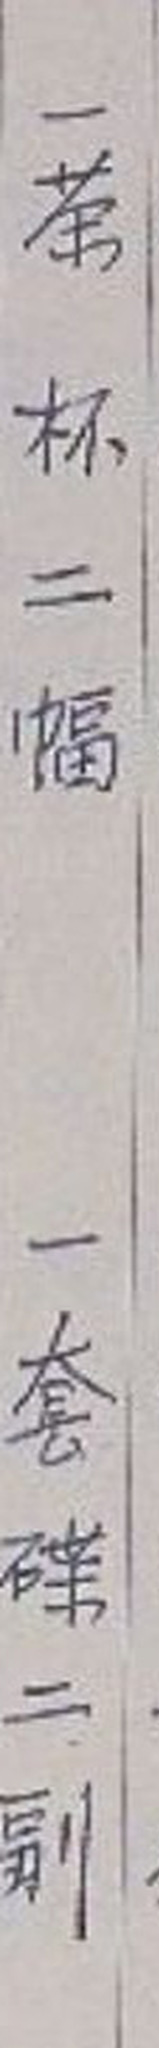一茶杯二幅一套碟二副
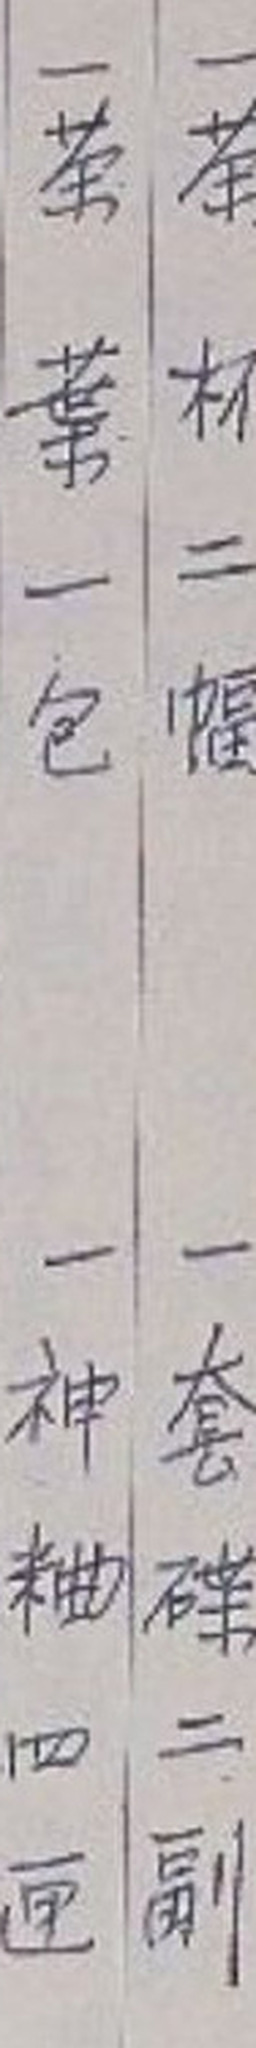一茶葉一包一神粬四匣
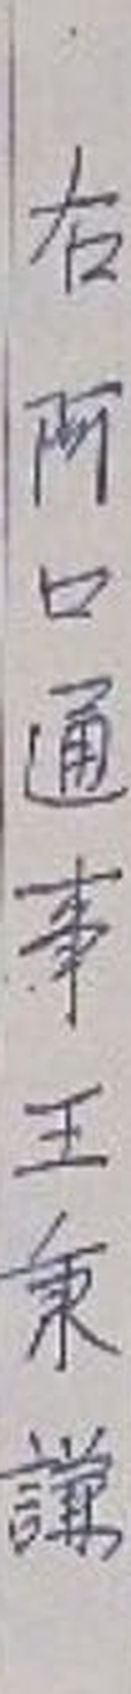右阿口通事王秉謙
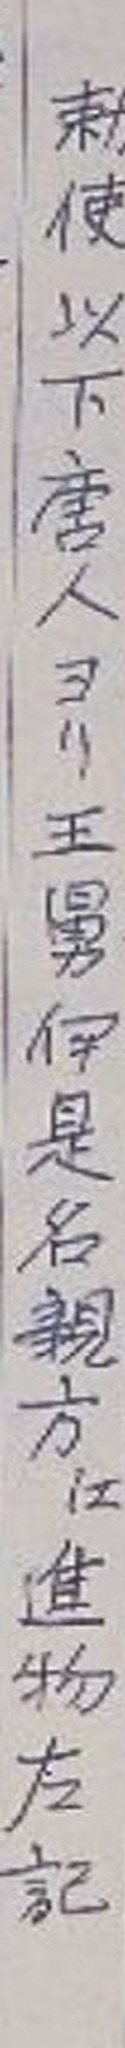勅使以下唐人より王舅伊是名親方え進物左記
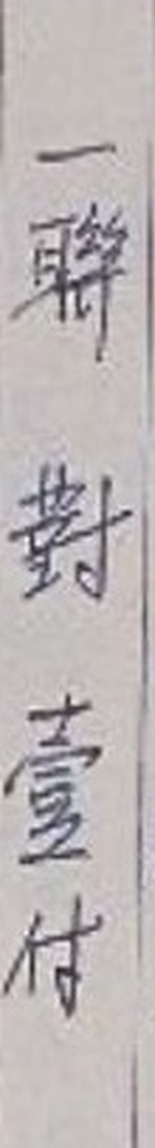一聯対壱付一扇壱把
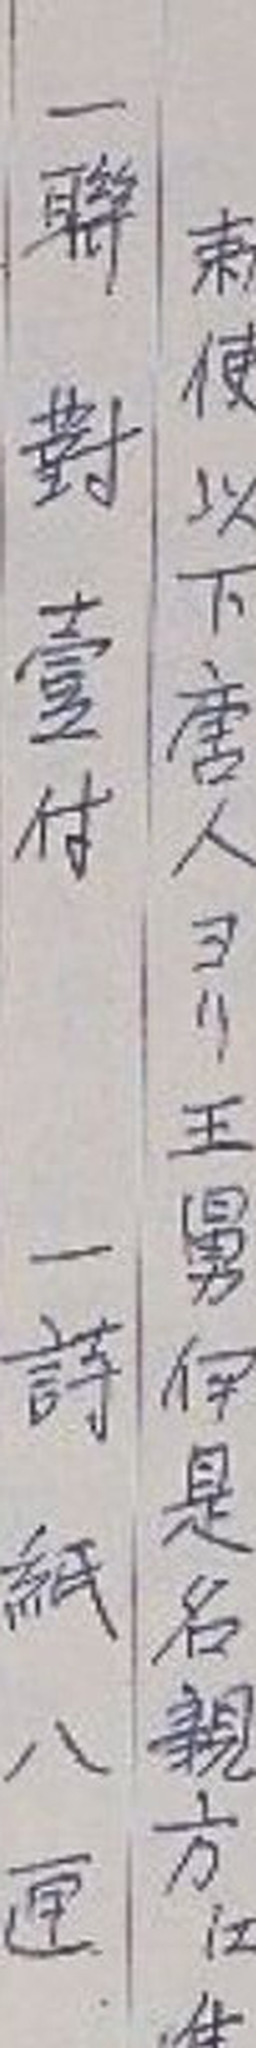一聯対壱付一詩紙八匣
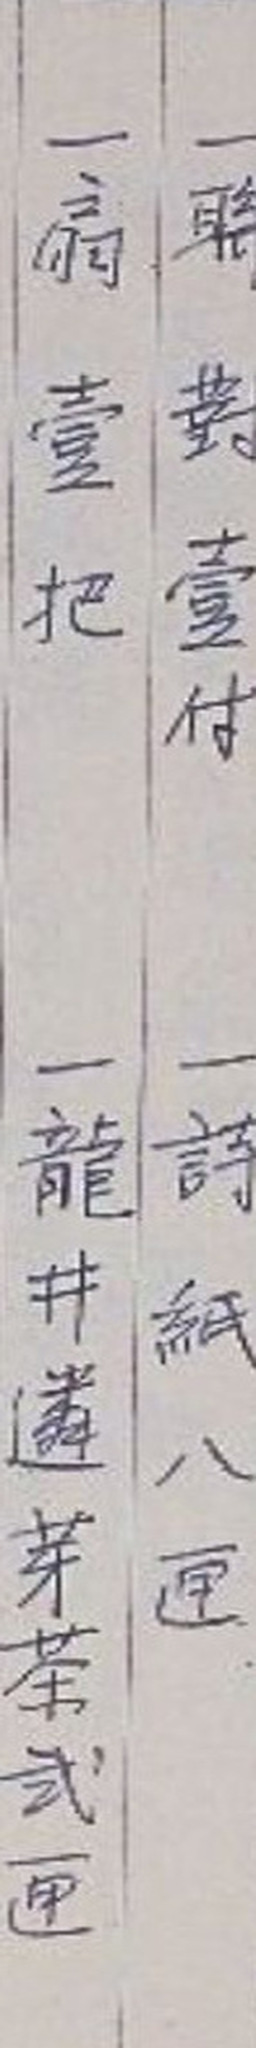一扇壱把一龍井遴芽茶弐匣
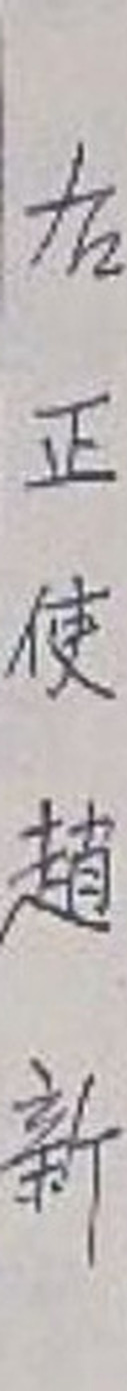右正使趙新
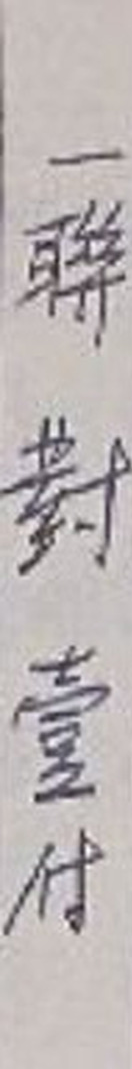一聯対壱付一詩紙八匣
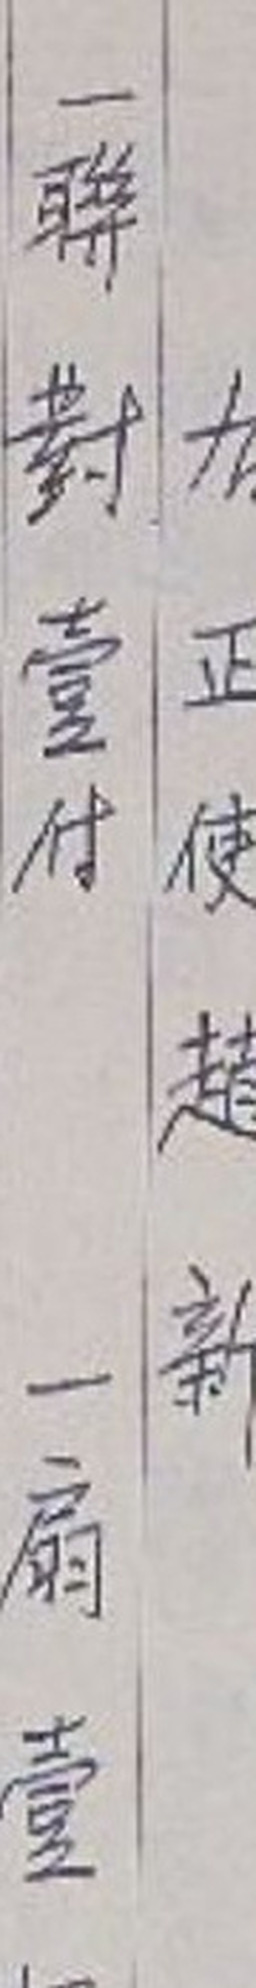一聯対壱付一扇壱把
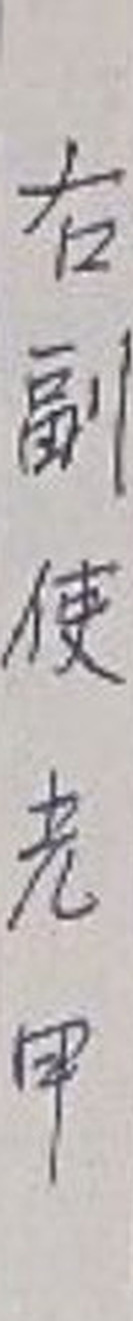右副使光甲
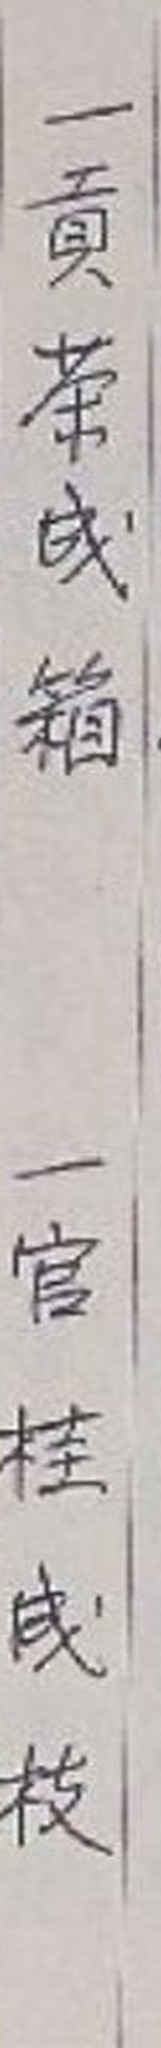一貢茶成箱一宮桂成枝
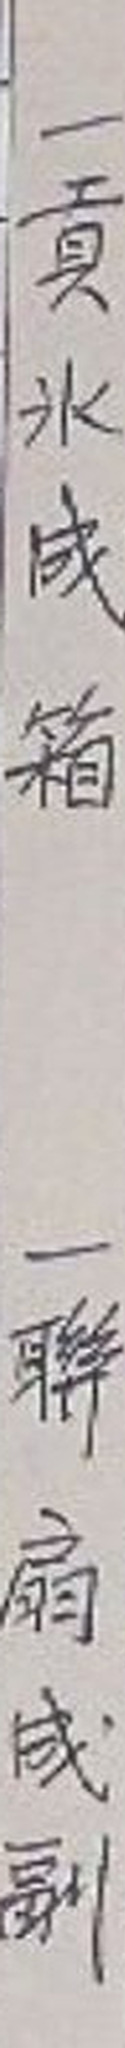一貢氷成箱一聯扇成副
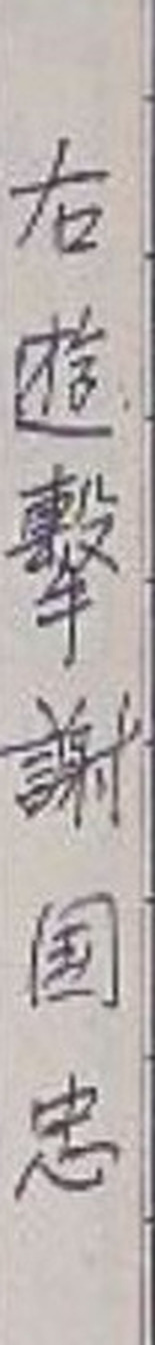右遊撃謝国忠
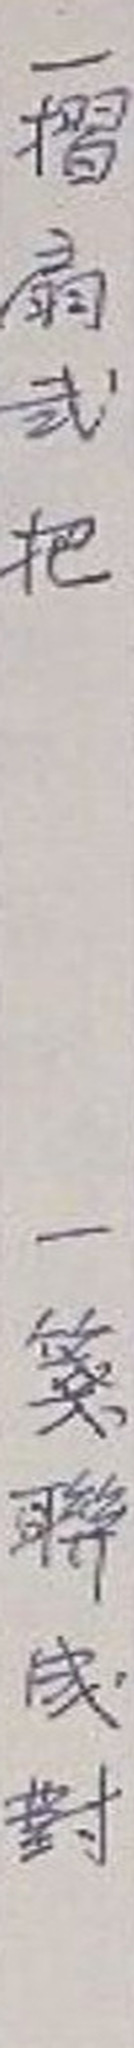一摺扇弐把一箋聯成対
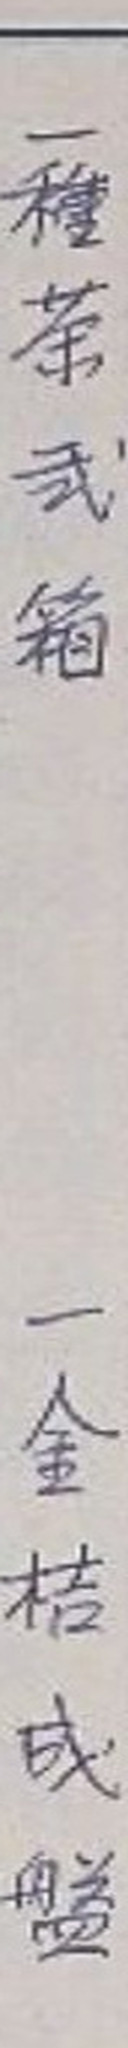一種茶成箱一金桔成盤
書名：支那冊封使来琉諸記 下巻
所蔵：University of the Ryukyus Library
